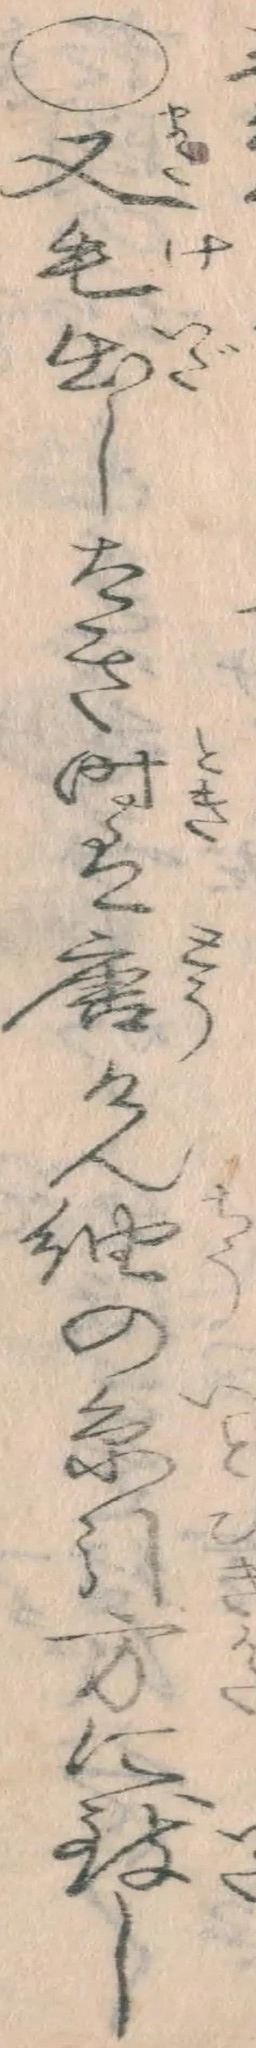○又毛出し太き時は唐けん紬の糸引方に致し

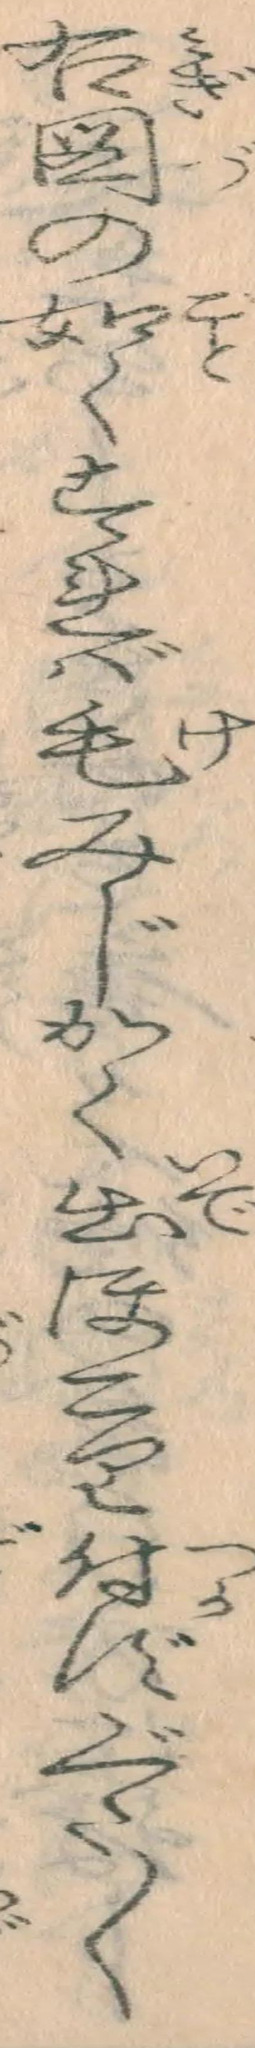右図の如くすれば毛みじかく出ほこり付すぐた〳〵
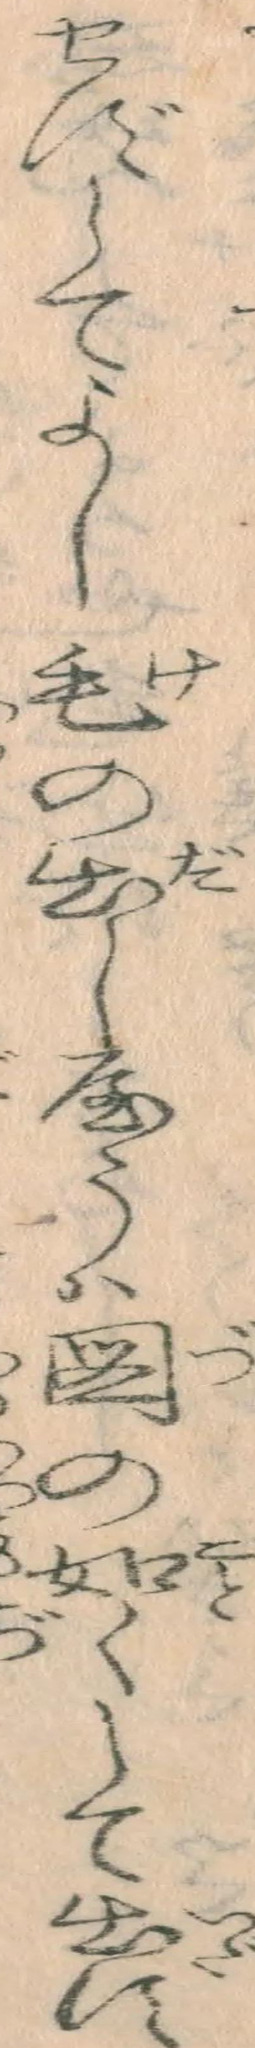せずしてよし毛の出やうは図の如くして出す
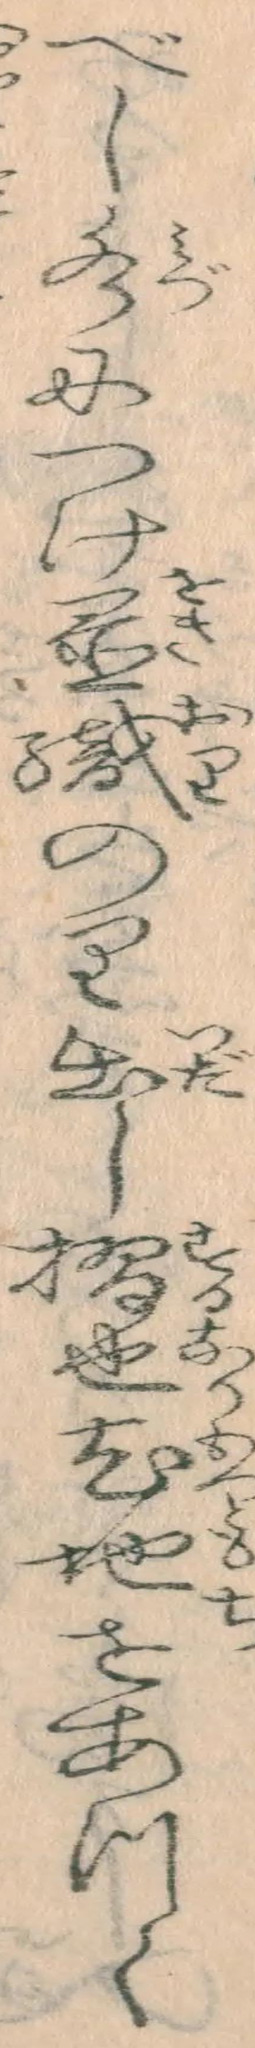べし水につけ置織のり出し摺也尤地をあつく
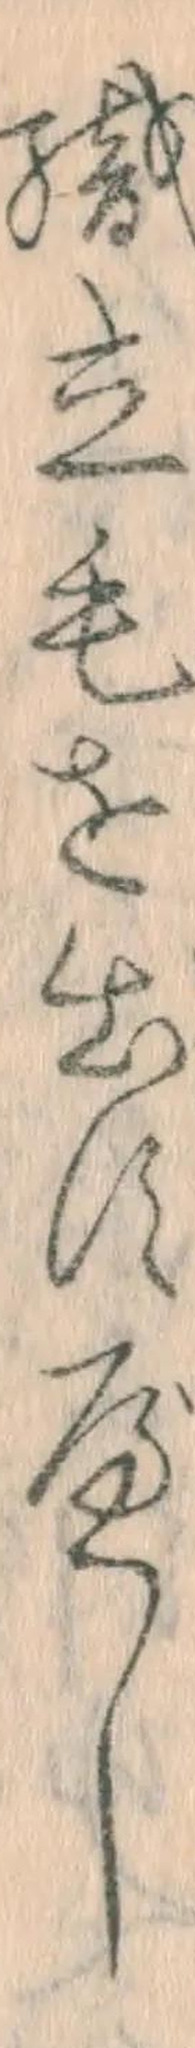織立毛を出すべし
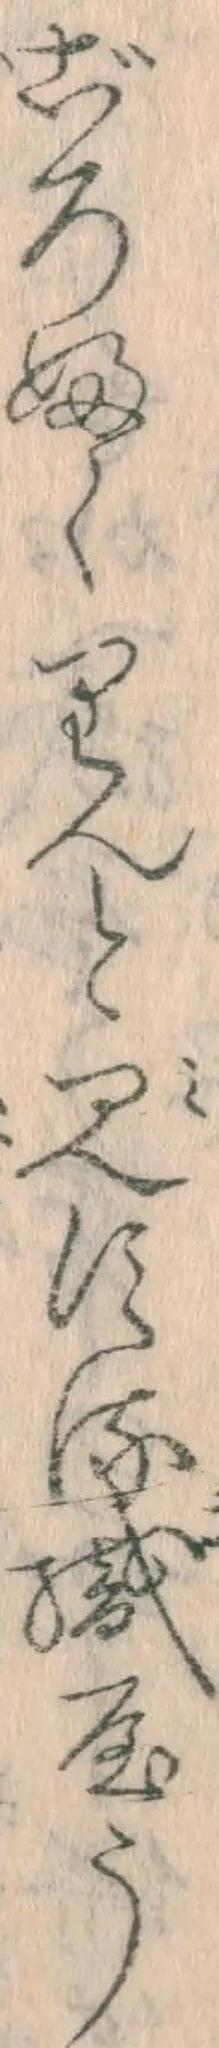ごろふくりんと見する織やう
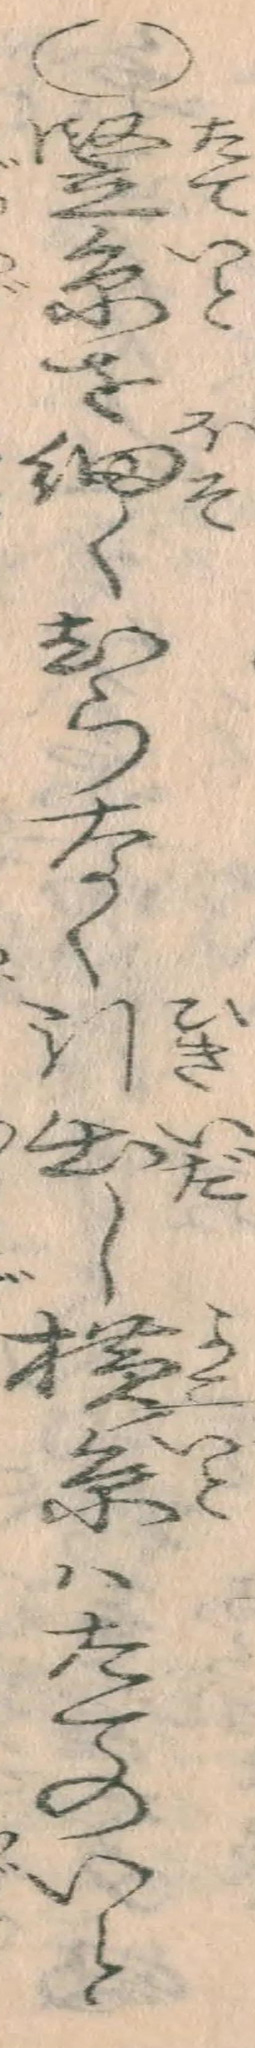○竪糸を細くむらなく引出し横糸はたてのいと
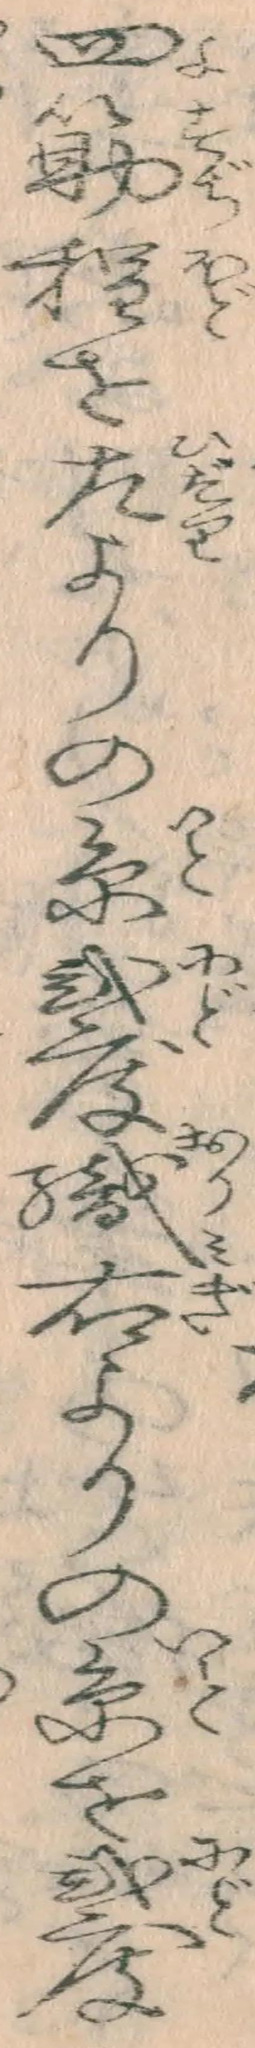四筋程を左よりの糸弐度織右よりの糸を弐度
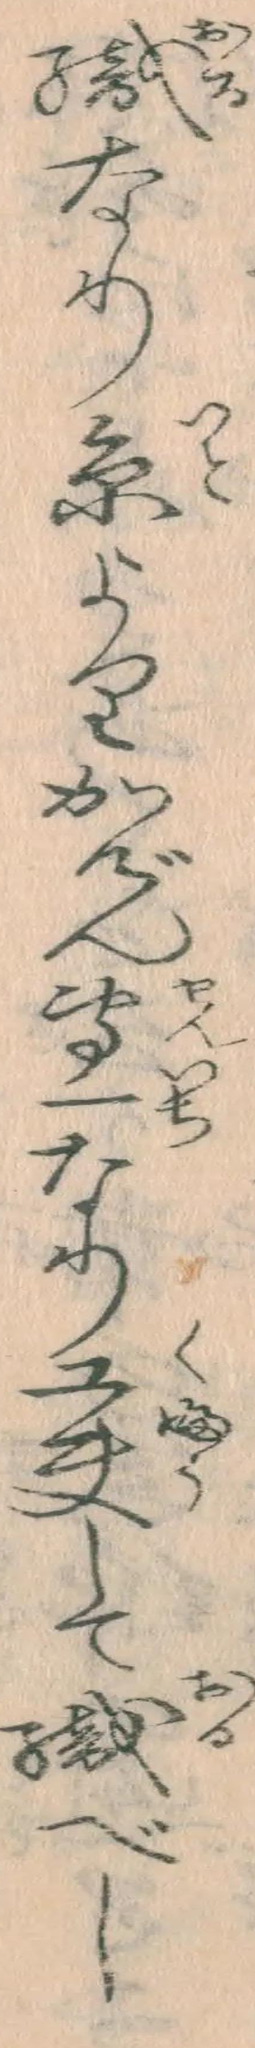織なり糸よりかげん専一なり工夫して織べし
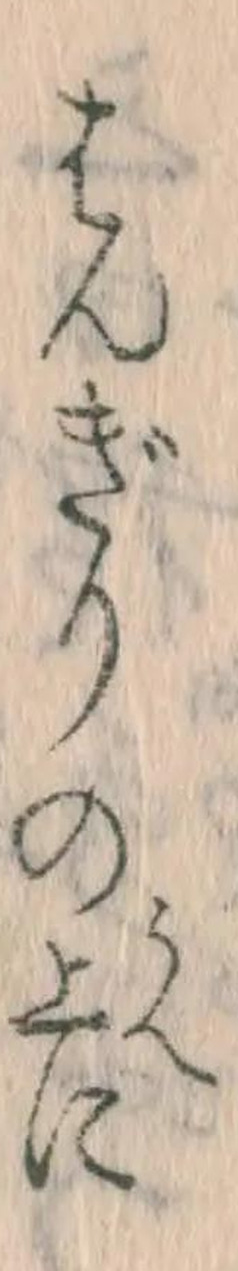はんぎりの上に
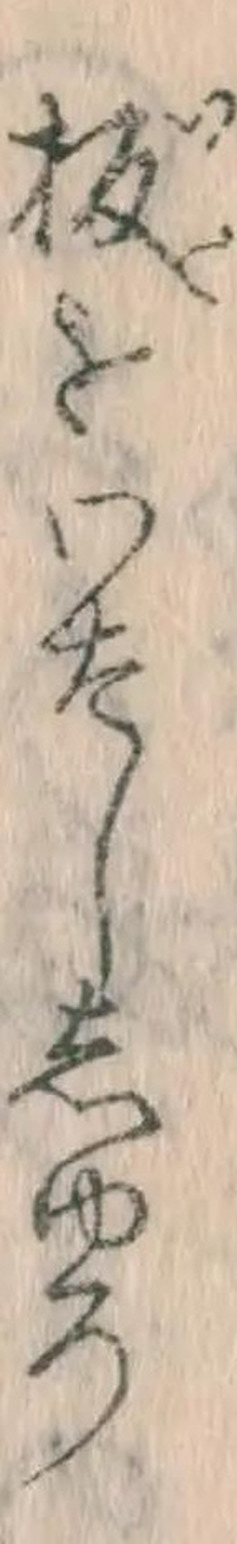板をわたししゆろ
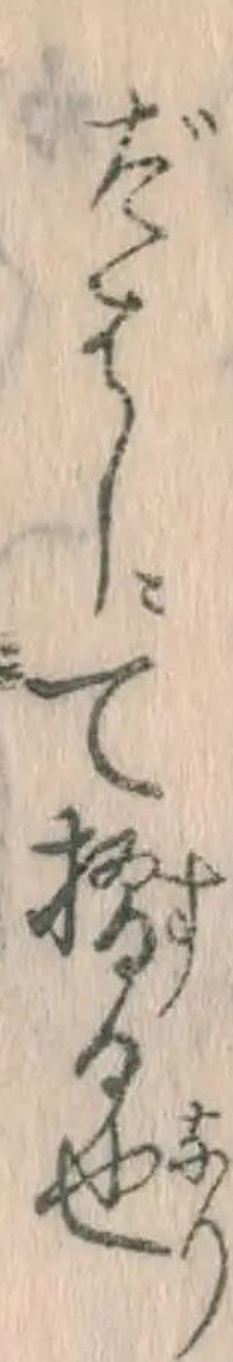だはしにて摺る也
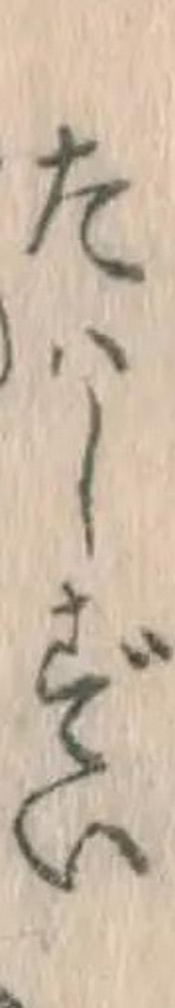たはしずい
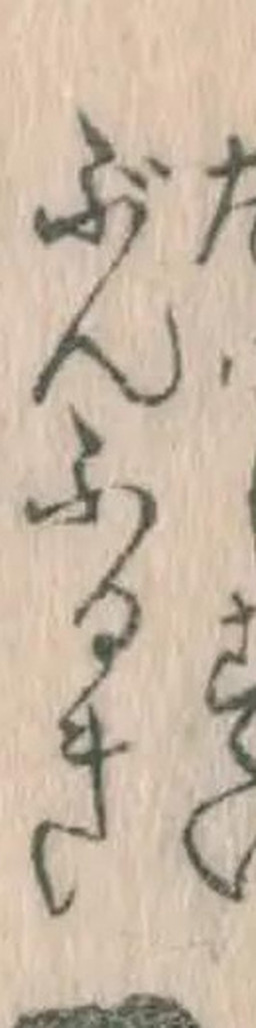ぶんふるき
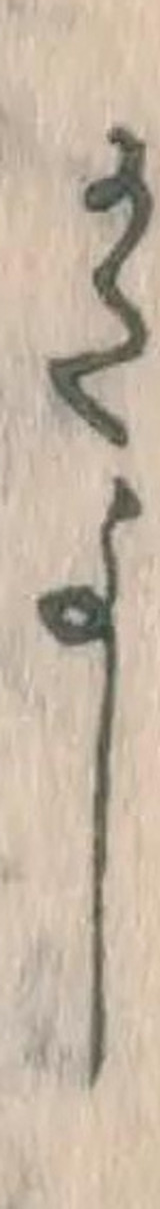かたよし
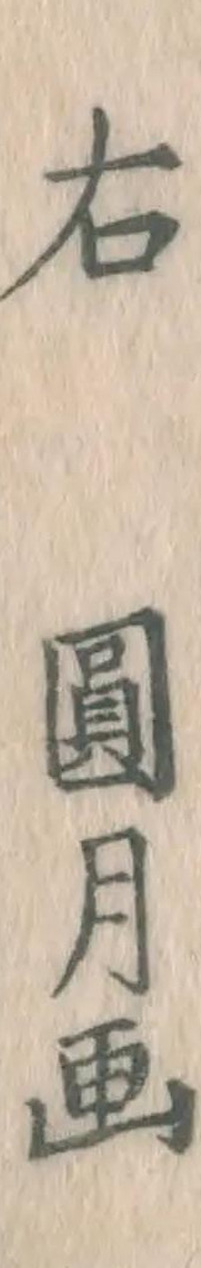右圓月画
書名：山繭養法秘傳抄
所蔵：国立国会図書館 National Diet Library, JAPAN
